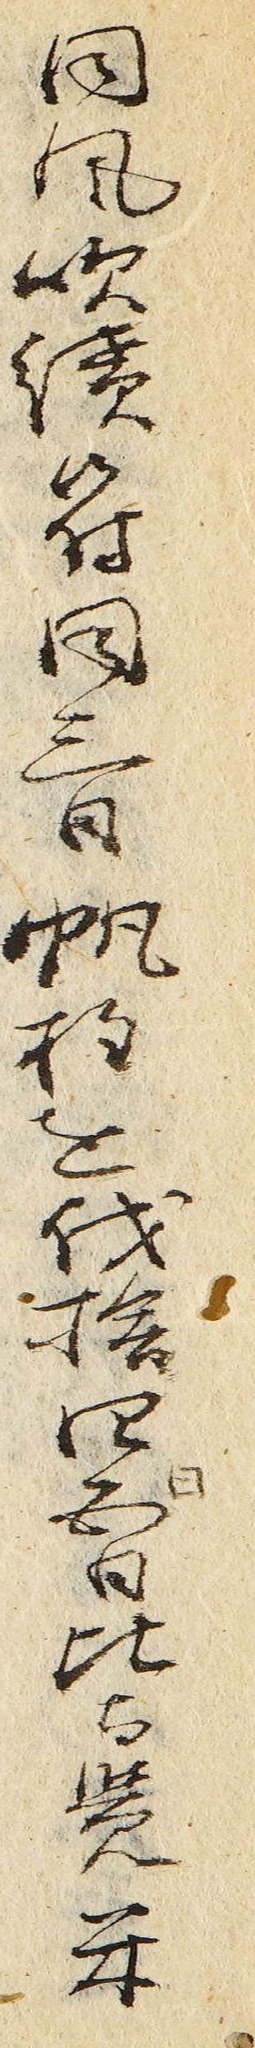同風吹続候付同三日帆柱を伐捨四日五日比と覚米
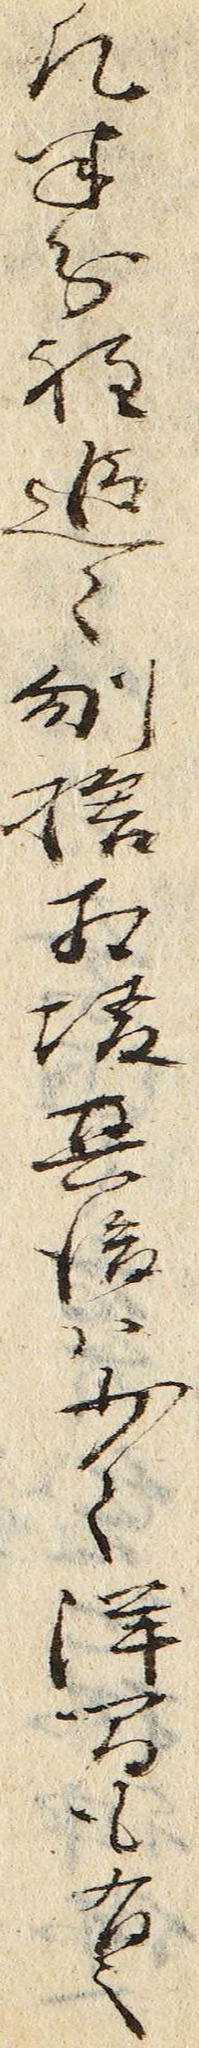凡半分程追々刎捨相凌其後は少々洋間も有之
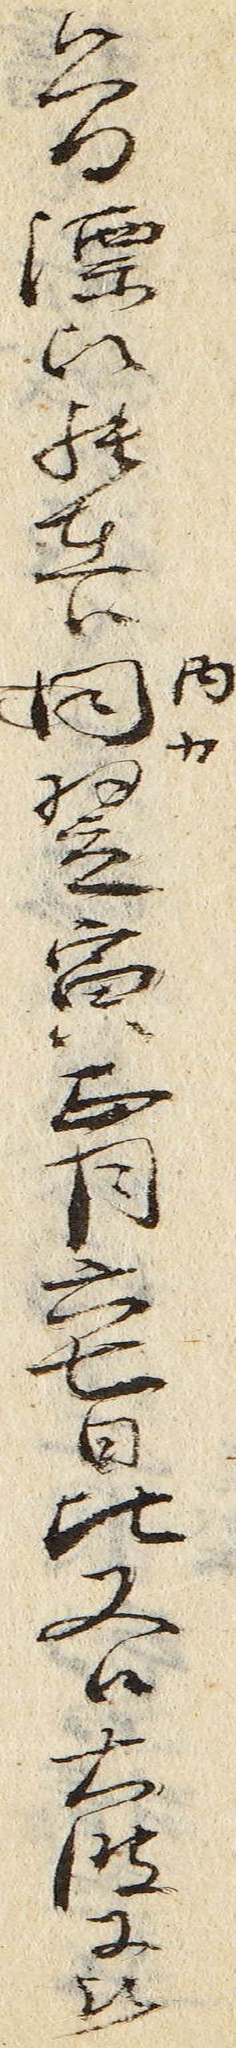候間漂ひ罷在候同翌寅正月六七日比又候大波に被
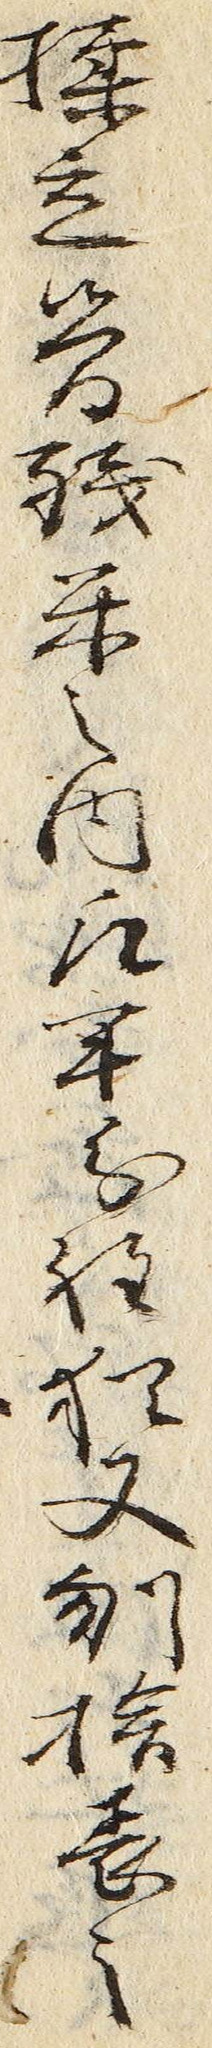揉立候間残米之内凡半分程猶又刎捨表之
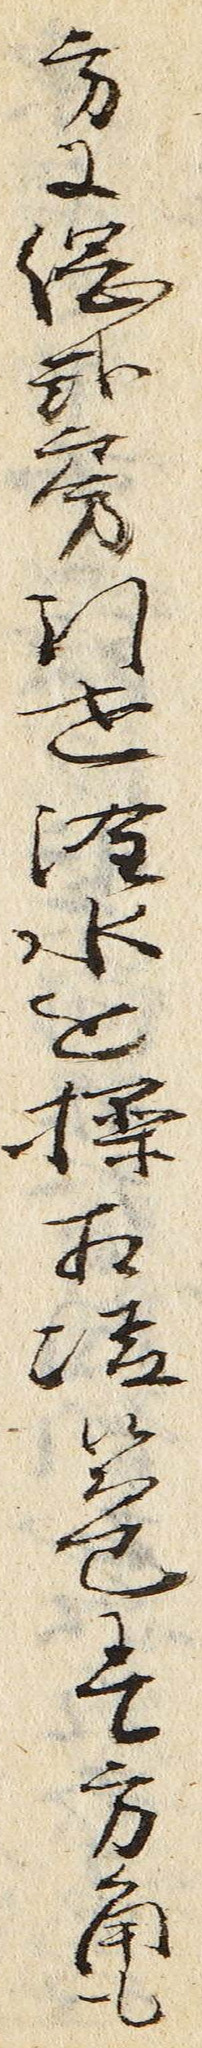方に綱弐房引せ淦水を操相凌候而已にて方角も
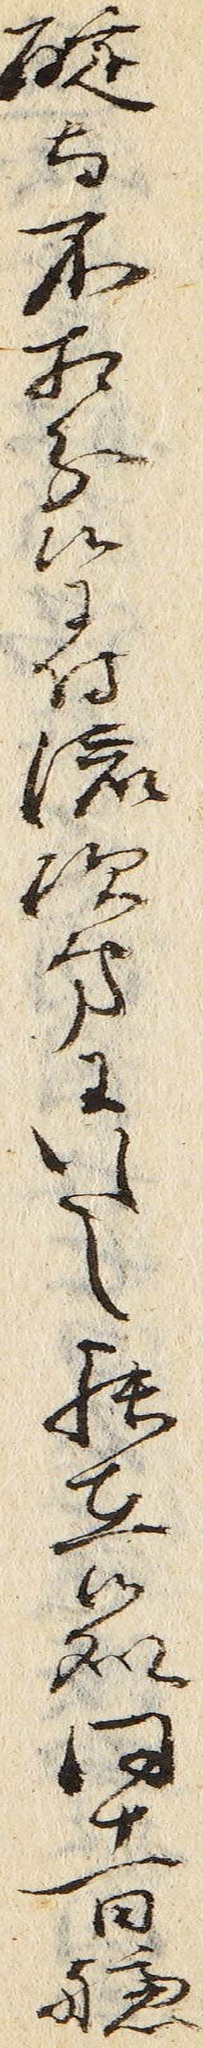聢と不相分候に付流次第にいたし罷在候処同十一日艫
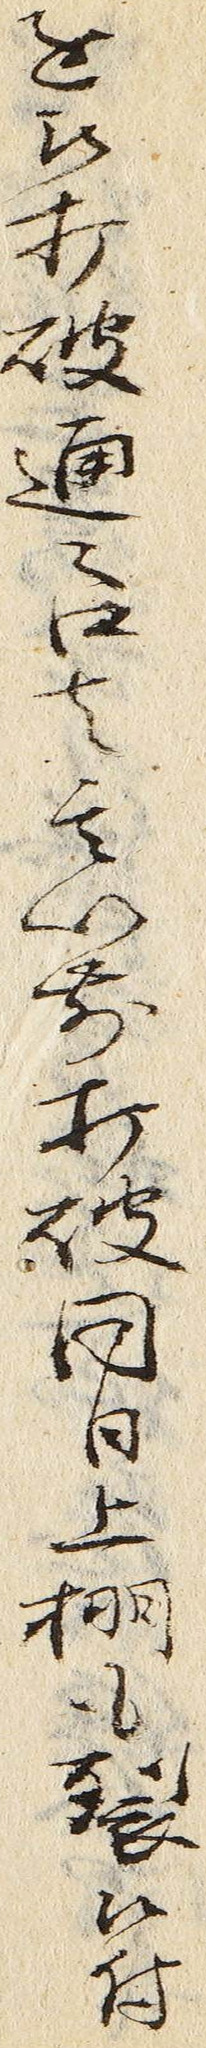を被打破通之口は其以前打破同日上棚も裂候付
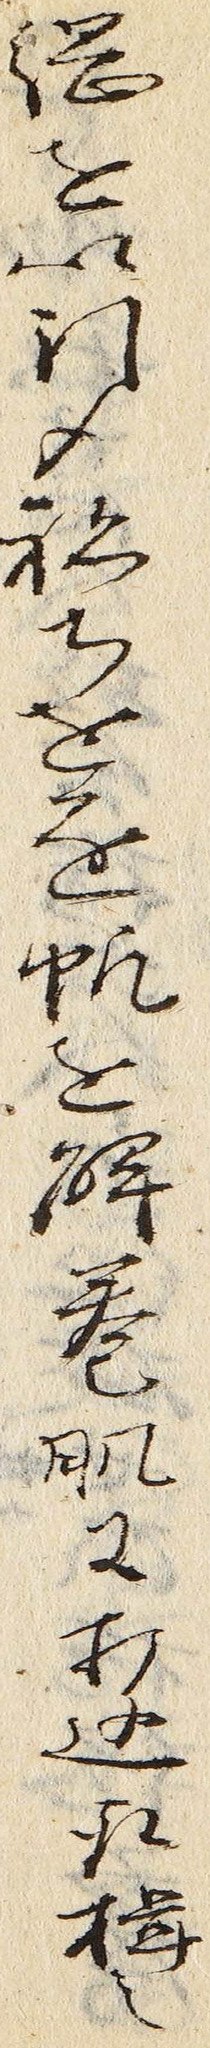綱を以引〆ねちを懸帆を解巻肌に打込取楫之
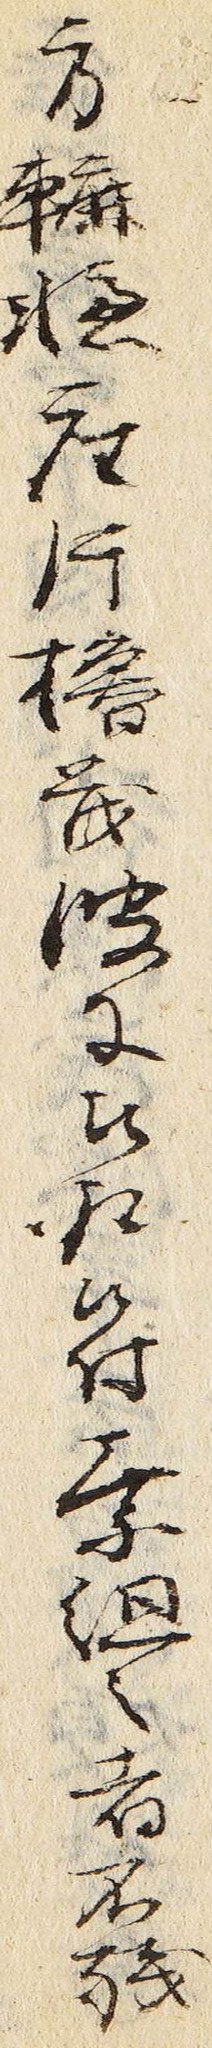方轆轤座片櫓も波に被取候付乗組之者不残
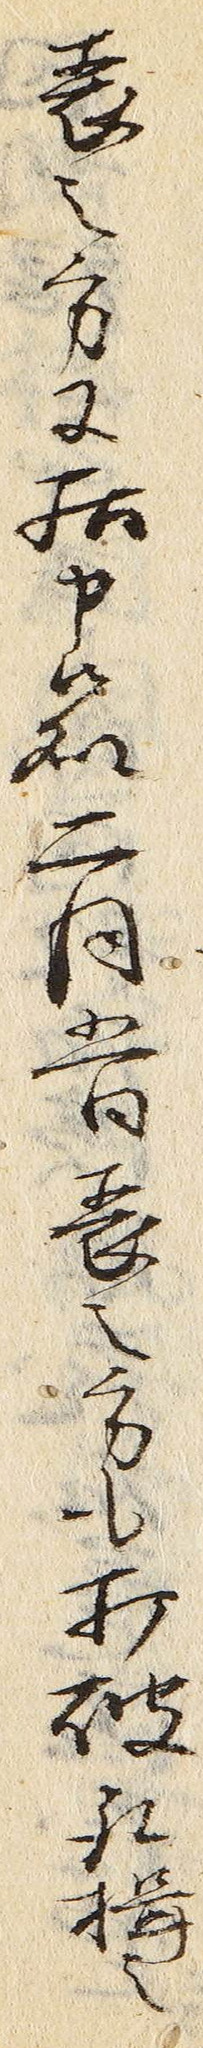表之方に居申候処二月五日表之方も打破取楫之
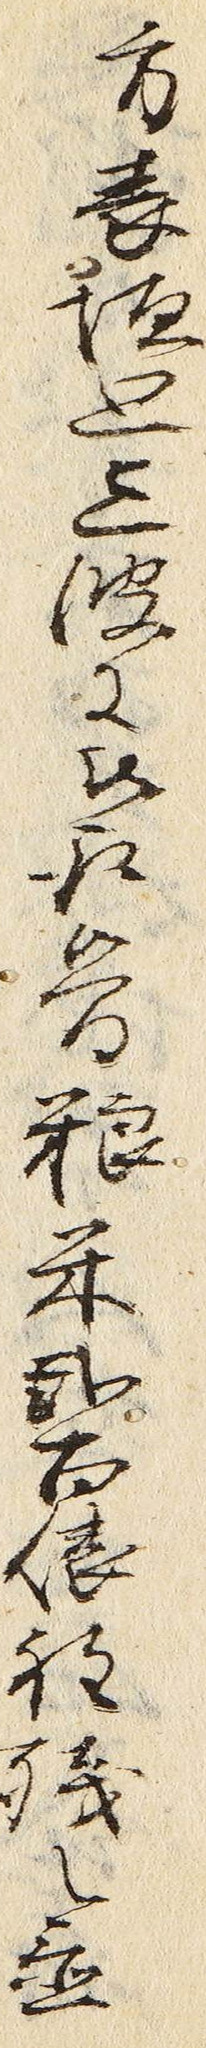方表◦垣廻迄波に被取候間粮米弐百俵程残し置
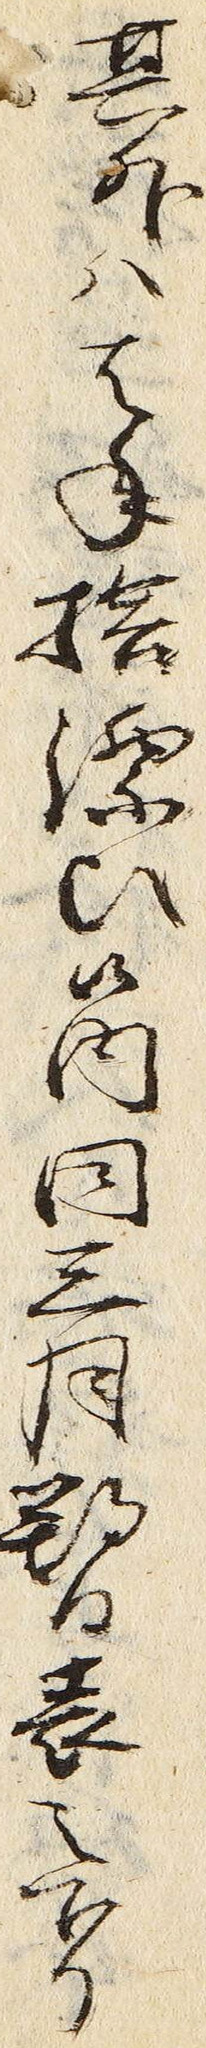其外ははね捨漂ひ候内同三月朔日表之下り
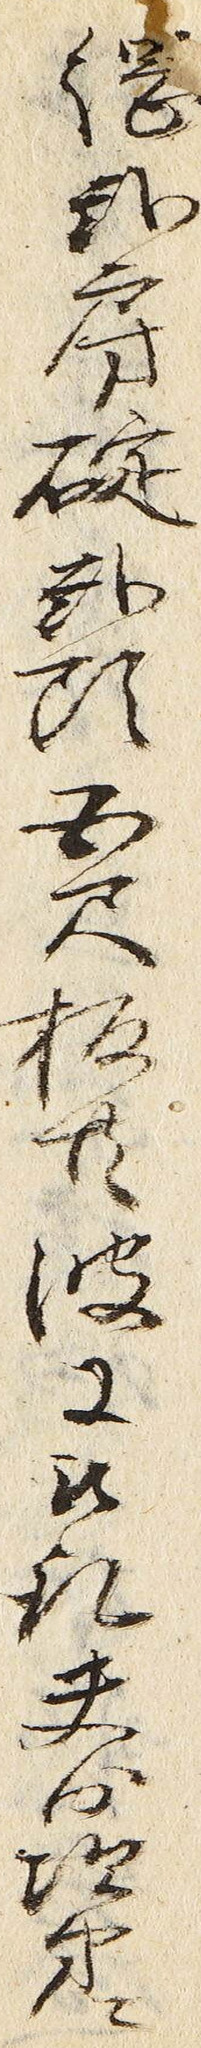綱弐房碇弐頭五尺板共波に被取夫ゟ次第に
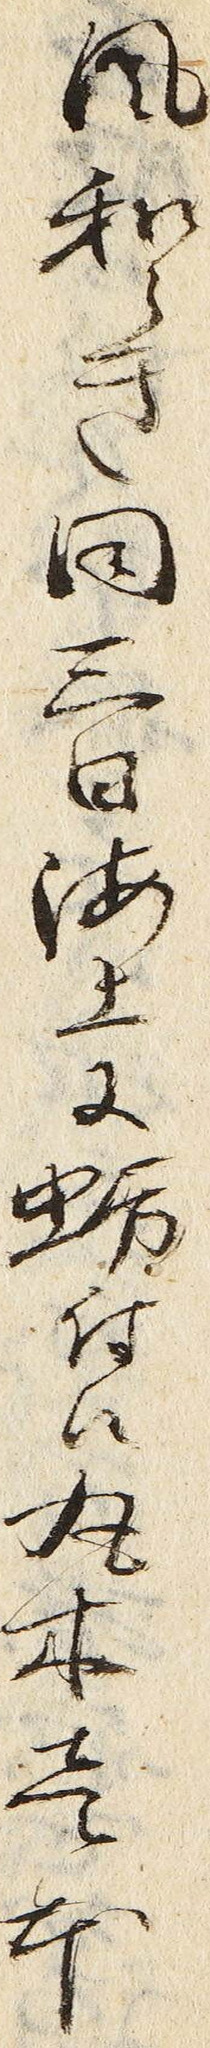風和らき同三日海上に蛎付候丸木壱本
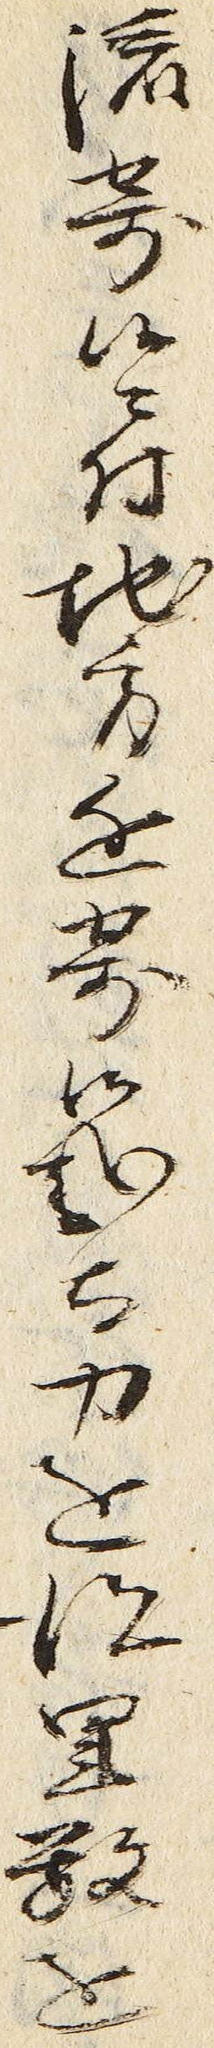流寄候に付地方近寄候哉と力を得里数を
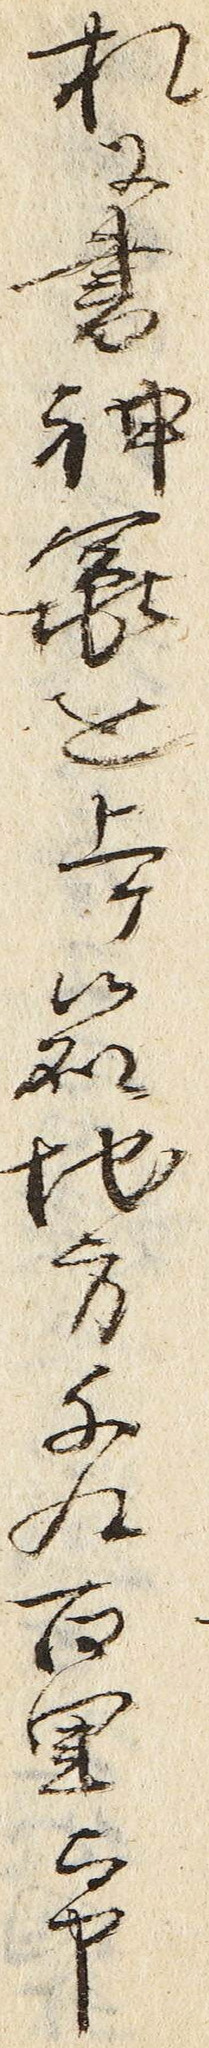札に書神鬮を上ヶ候処地方千九百里と申
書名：漂民後記
